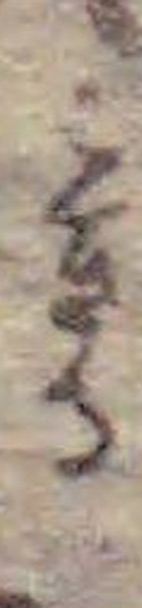ござる
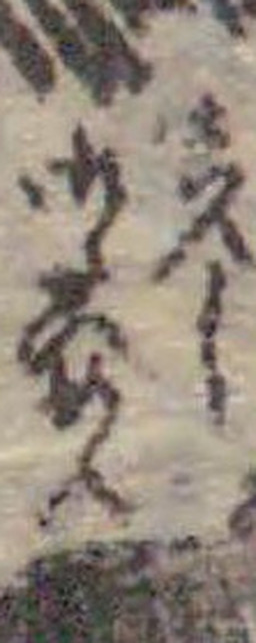御たいめん
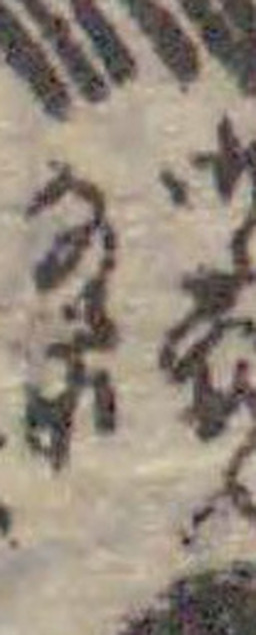なされ
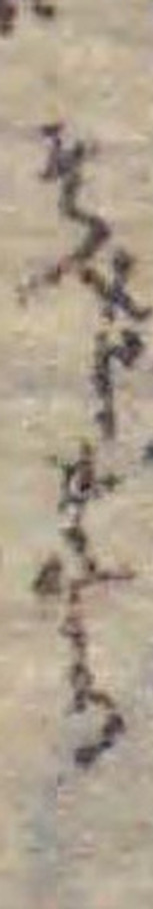そんじまする

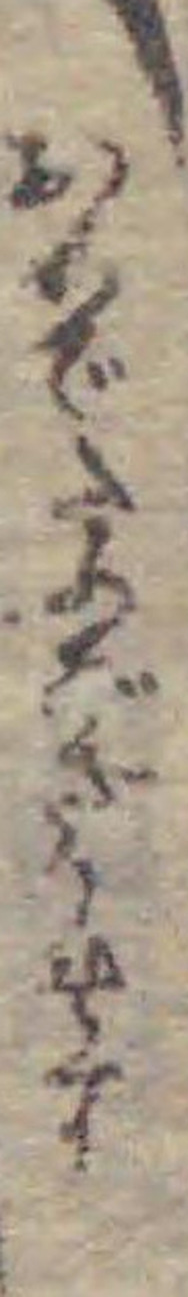おめでたふござります
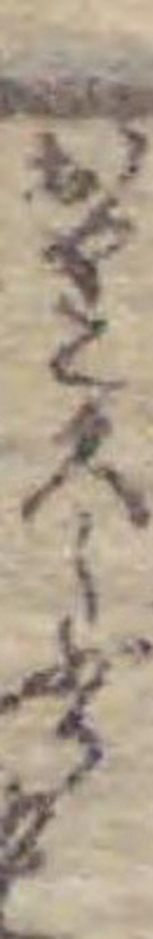おやこ久しぶりにて
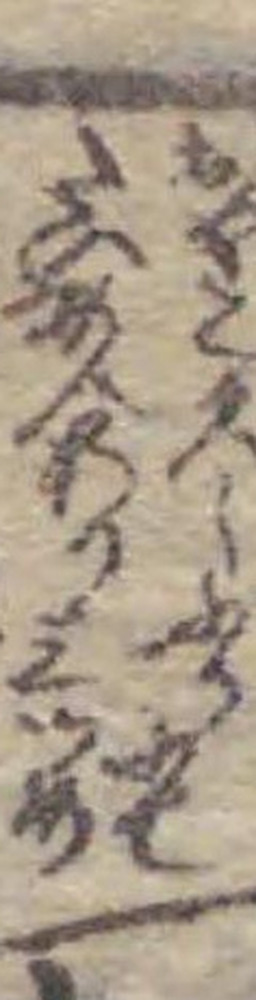たいめんあり三つ目
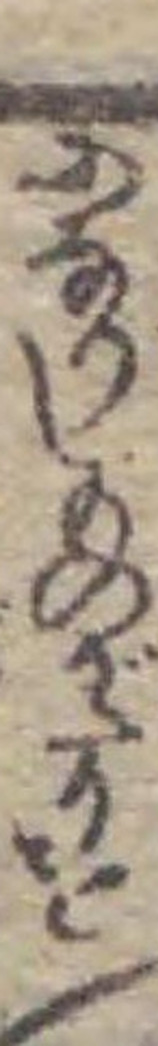になりしものがたりを
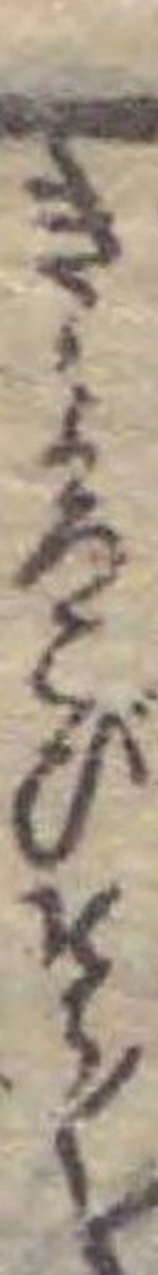きゝよろこびそう〳〵
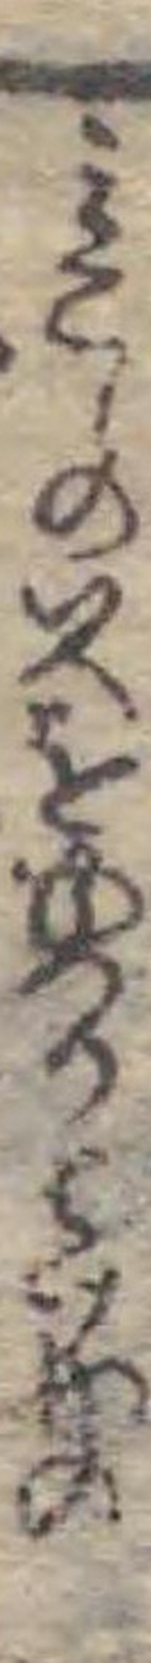みこしのいへをゆづりはけ物の
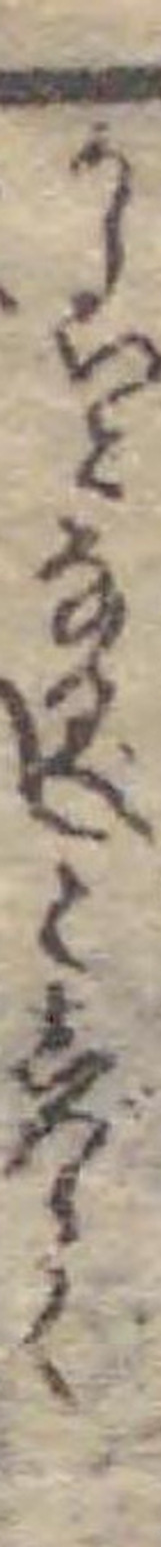かしらとなるへしとしばらく
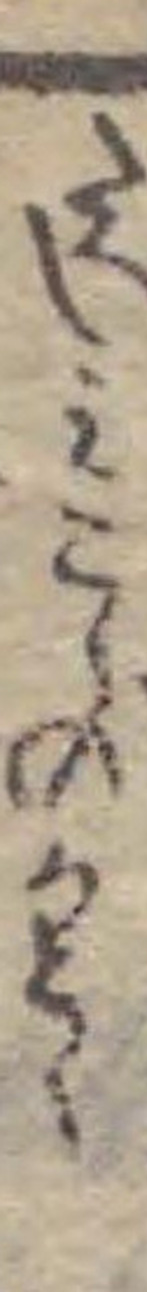たへしみこしのかとく
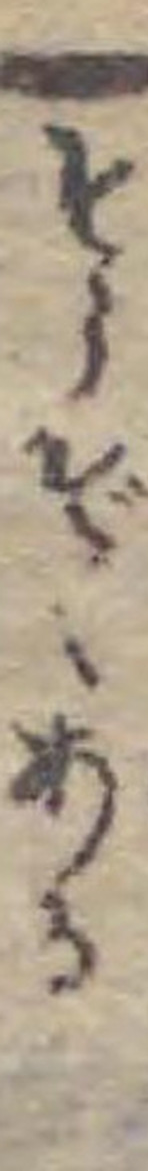そくぞくある
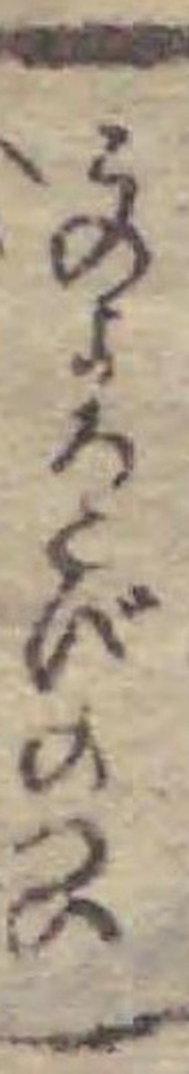このよろこびのつい
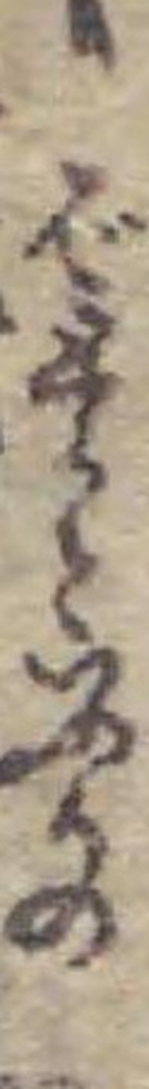ばとうといふかの
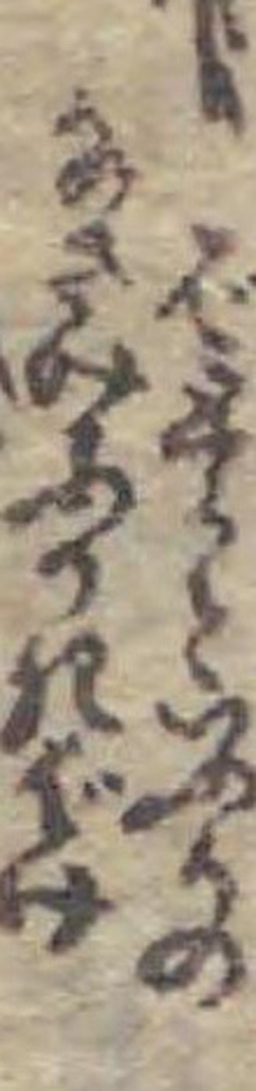なさけふかきばけ
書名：[化物一代記] : 5巻
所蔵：国立国会図書館 National Diet Library, JAPAN
